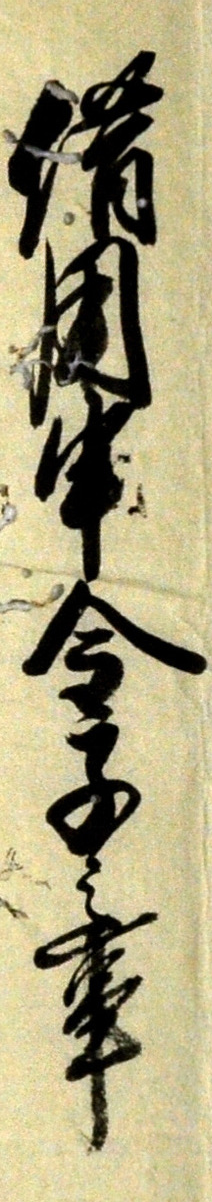借用申金子之事
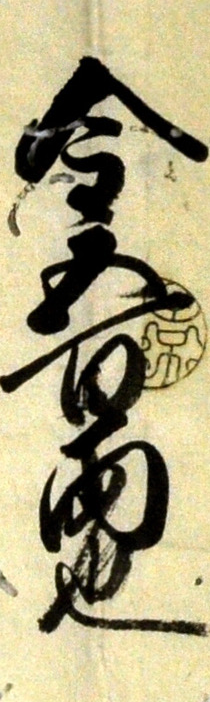金五百両也
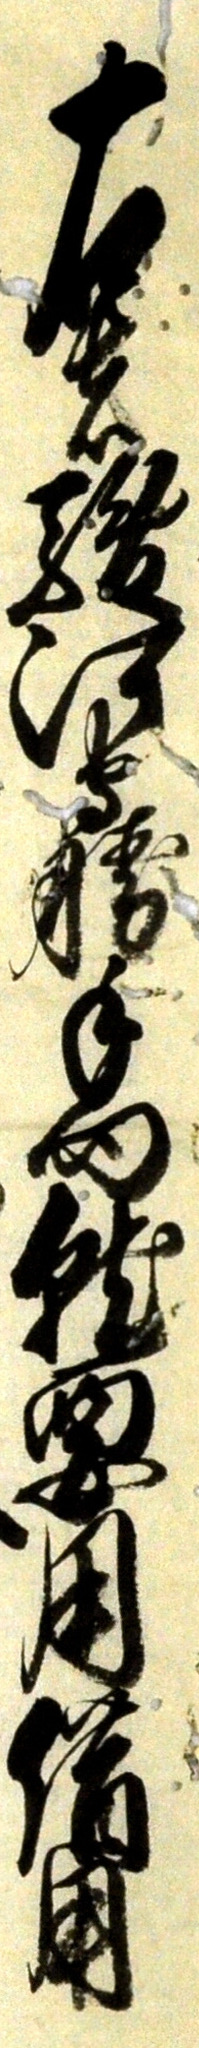右者駿河守勝手向就要用借用
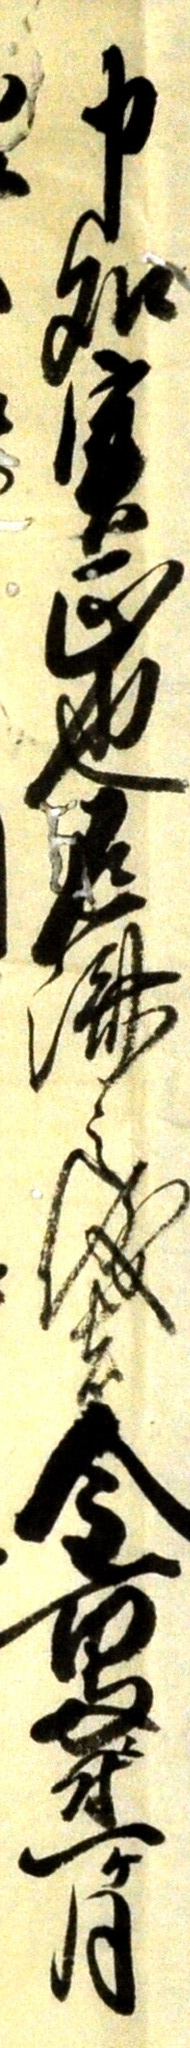申処実正也返済之儀者金百両ニ付一ヶ月
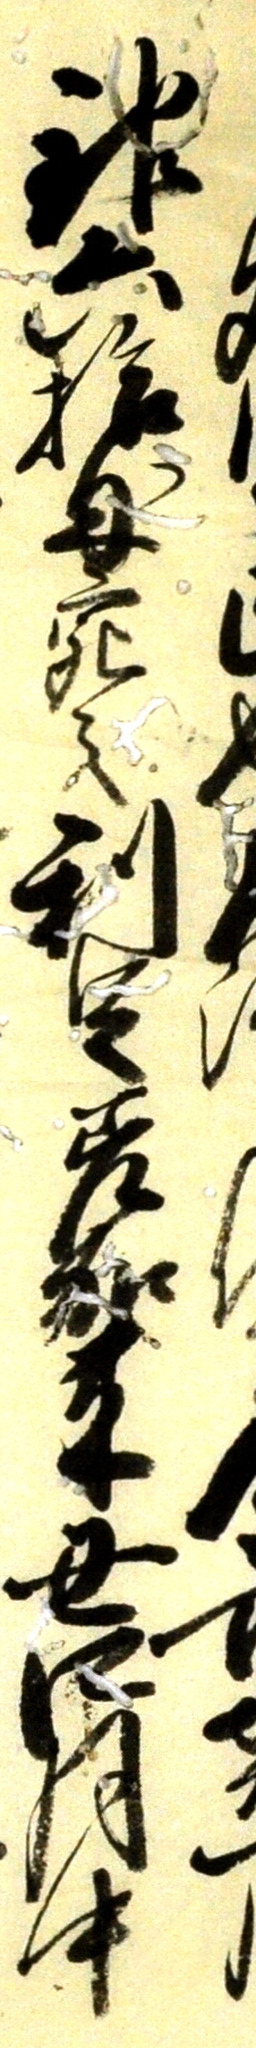銀六拾匁宛之利足差加来丑四月中
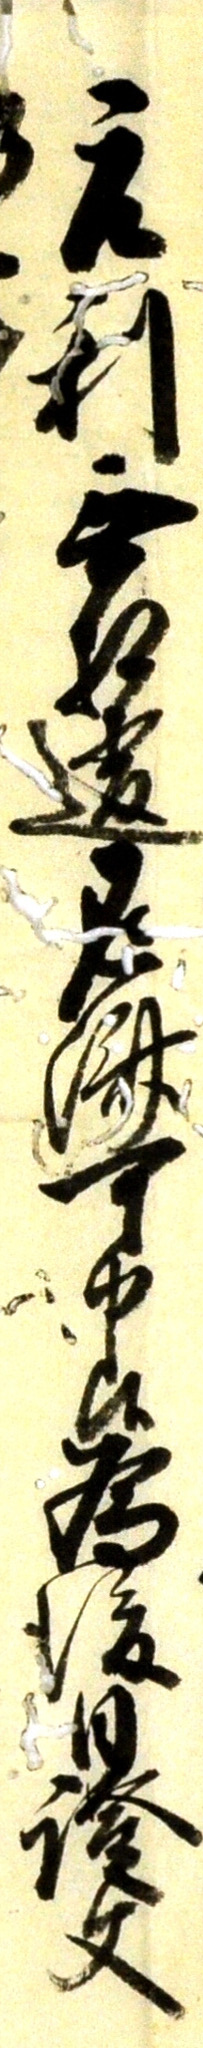元利無相違返済可申候為後日証文
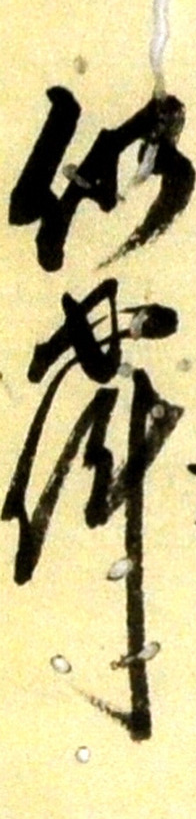仍如件
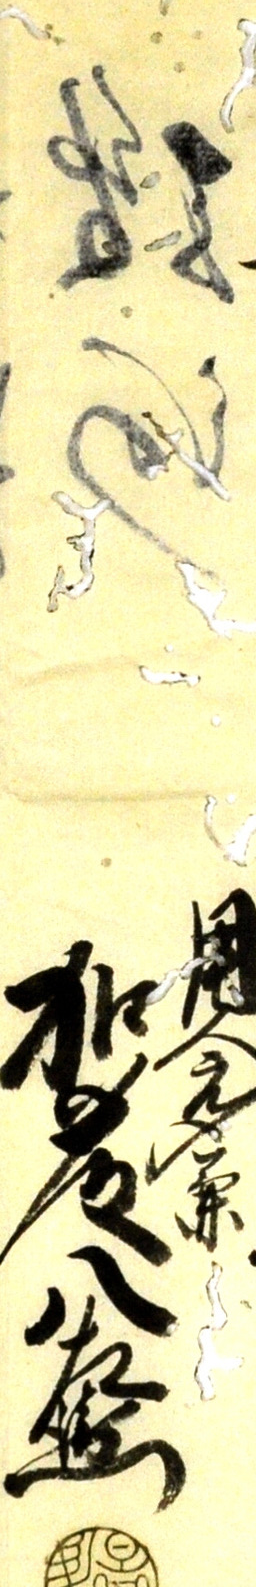加藤八左衛門㊞
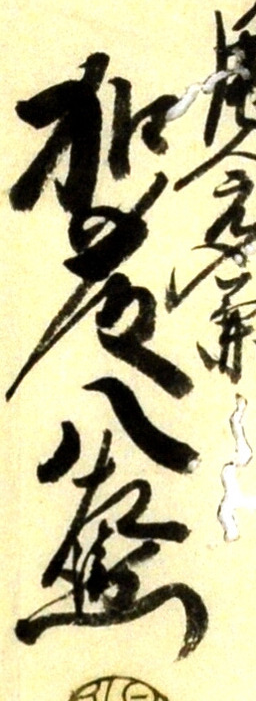加藤八左衛門㊞
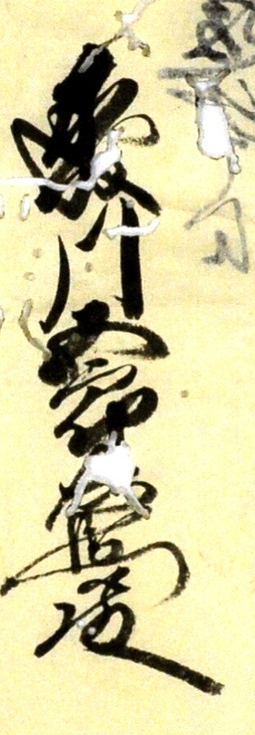森川五郎右衛門殿
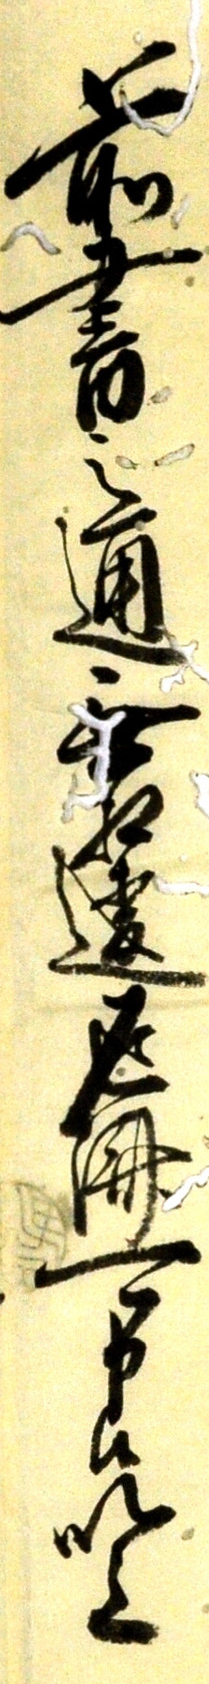前書之通無相違返済可申候以上

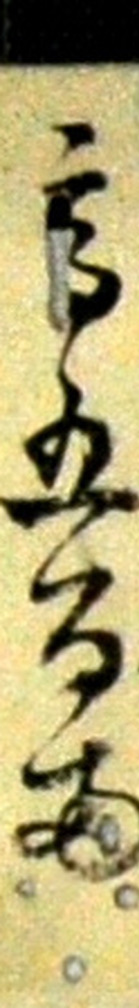高五百両
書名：借用申金子之事
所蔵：伊那市立高遠町図書館・合同会社AMANE
